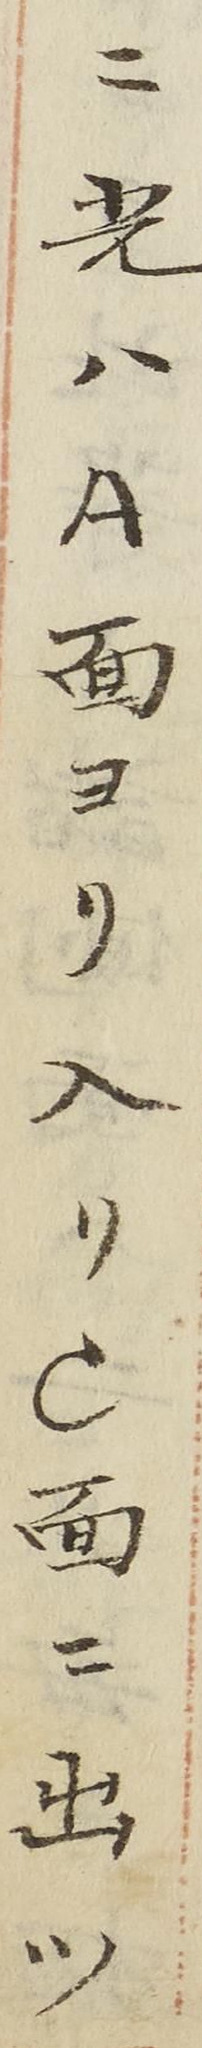八ニ光ハＡ面ヨリ入リＣ面ニ出ツ

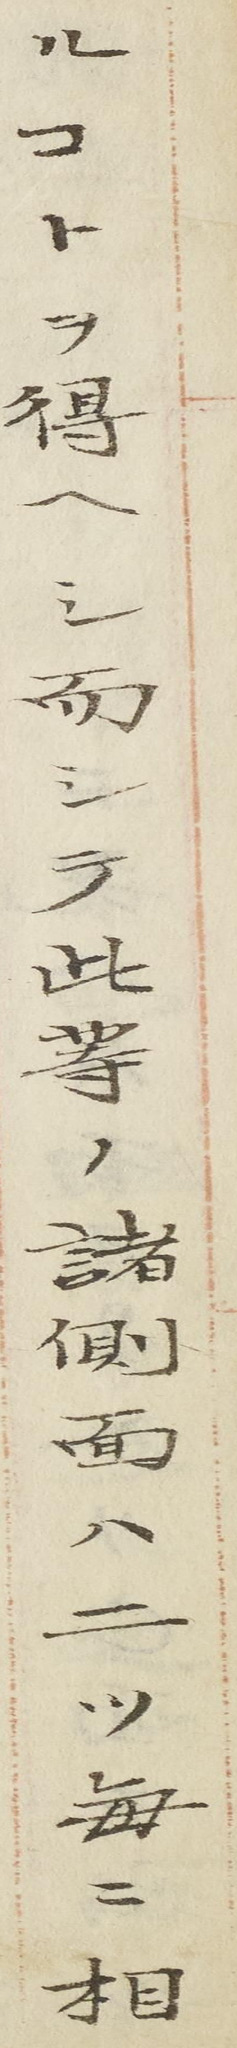ルコトヲ得ヘシ而シテ此等ノ諸側面ハ二ツ毎ニ相
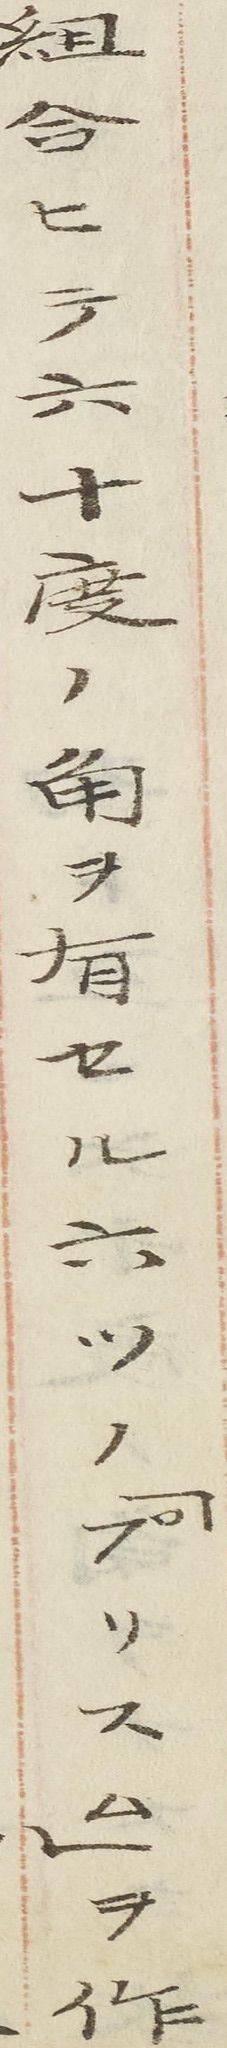組合ヒテ六十度ノ角ヲ有セル六ツノ「プリスム」ヲ作
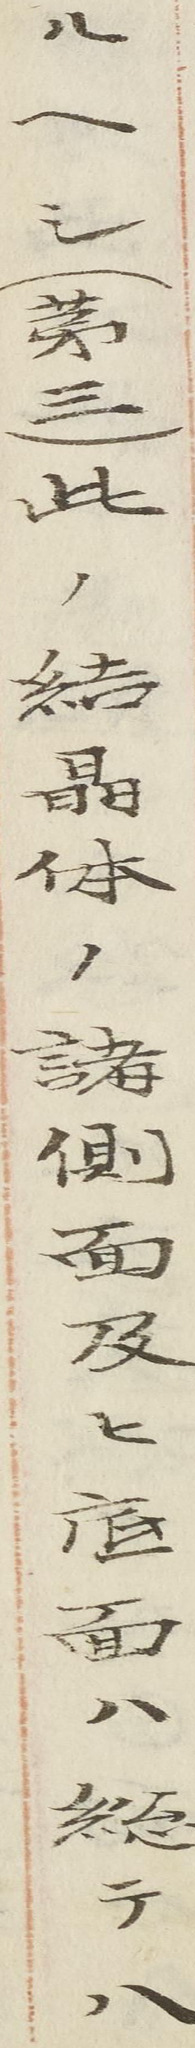ルヘシ此ノ結晶体ノ諸側面及ヒ底面ハ総テ八
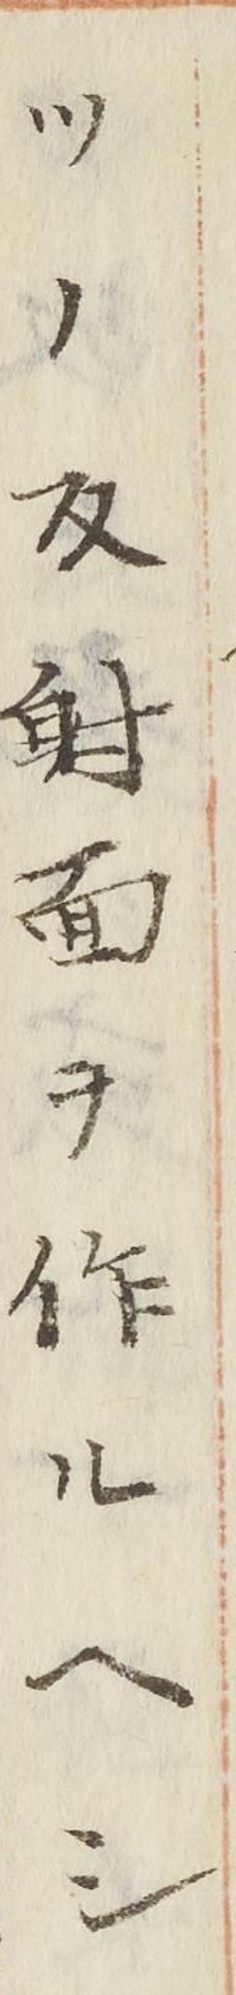ツノ反射面ヲ作ルヘシ
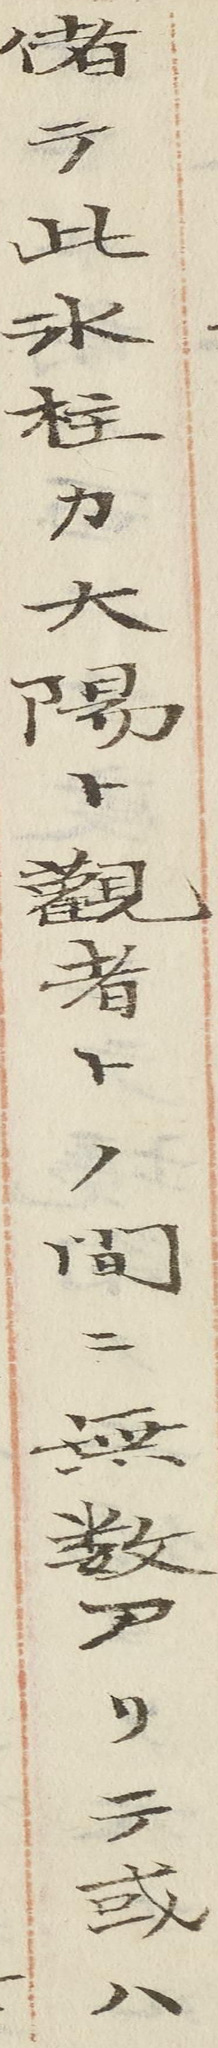偖テ此氷柱カ大陽ト観者トノ間ニ無数アリテ或ハ
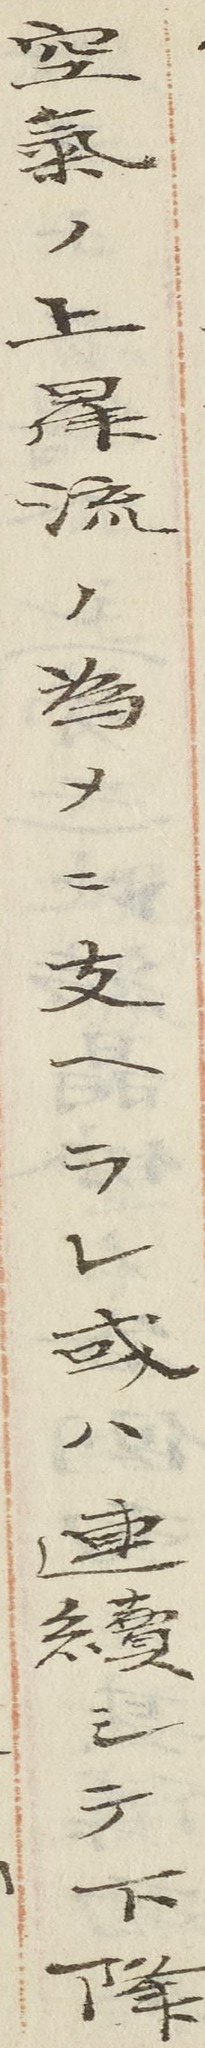空気ノ上昇流ノ為メニ支ヘラレ或ハ連続シテ下降
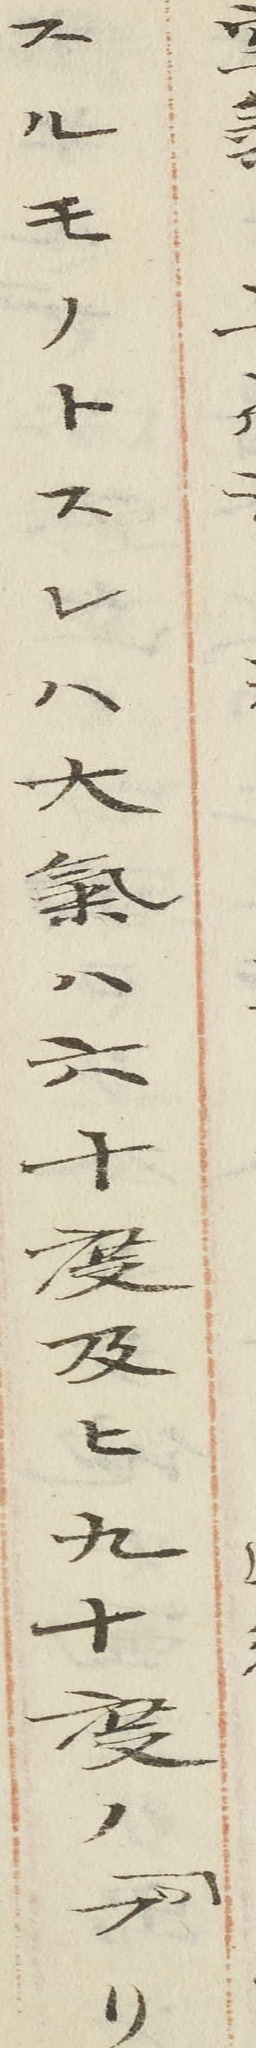スルモノトスレハ大気ハ六十度及ヒ九十度ノ「プリ
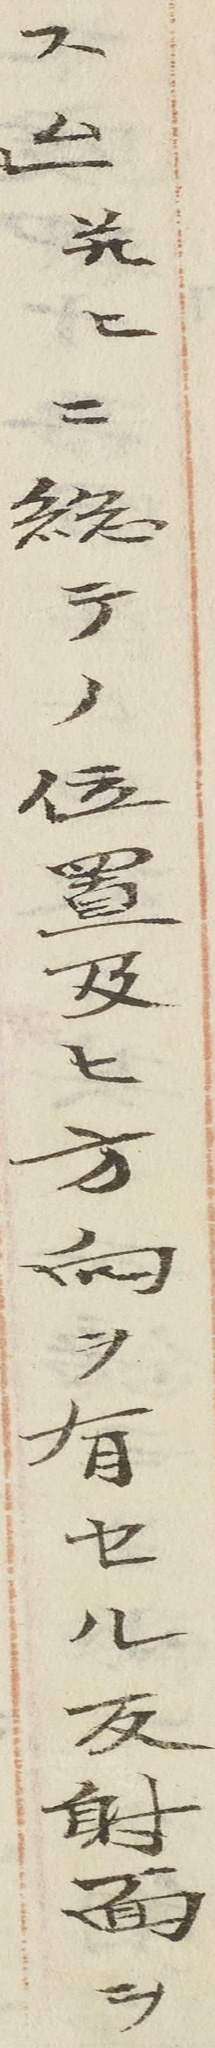スム）幷ヒニ総テノ位置及ヒ方向ヲ有セル反射面ヲ
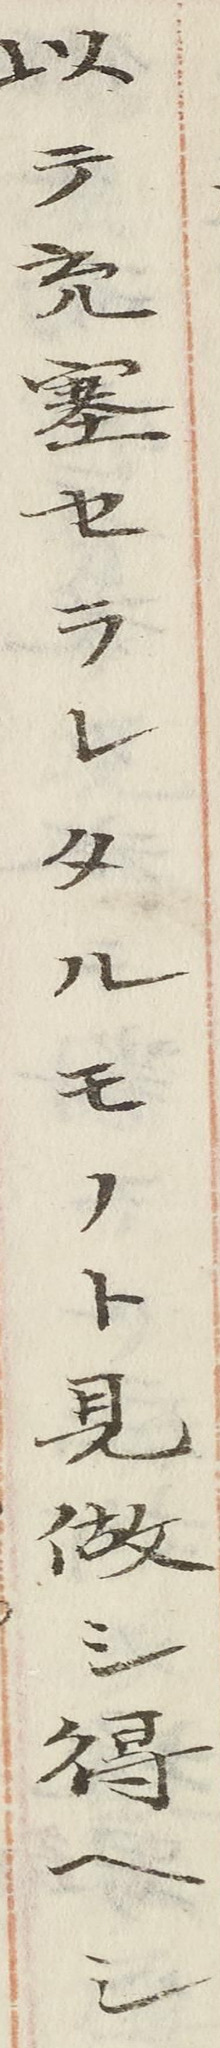以テ充塞セラレタルモノト見做シ得ヘシ
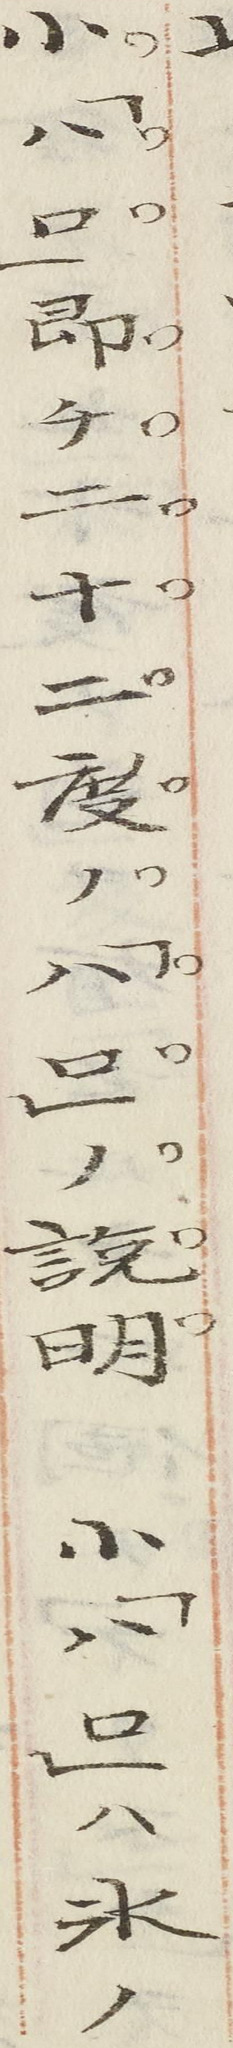小「ハロ」即チ二十二度ノ「ハロ」ノ説明小「ハロ」ハ氷ノ
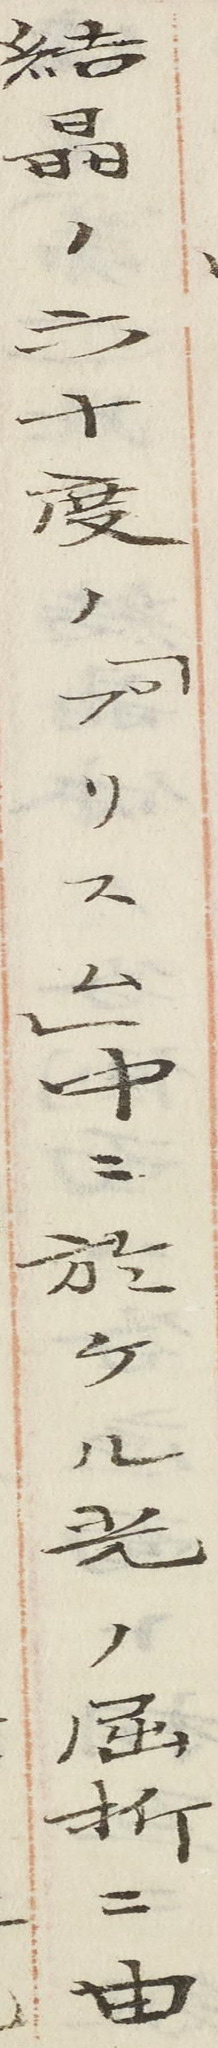結晶ノ六十度ノ「プリスム）中ニ於ケル光ノ屈折ニ由
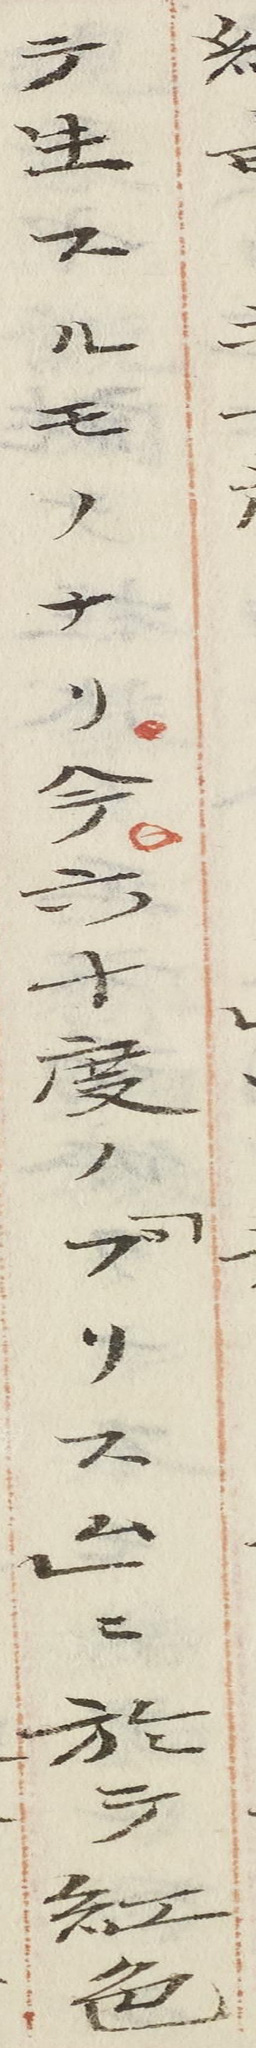テ生スルモノナリ今六十度ノ「プリスムニ於テ紅色
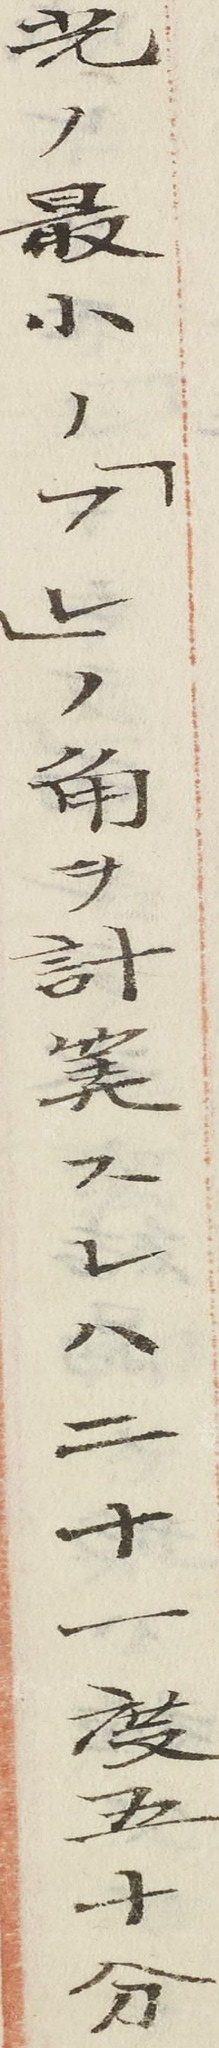光ノ最小ノ「フレ」ノ角ヲ計算スレハ二十一度五十分
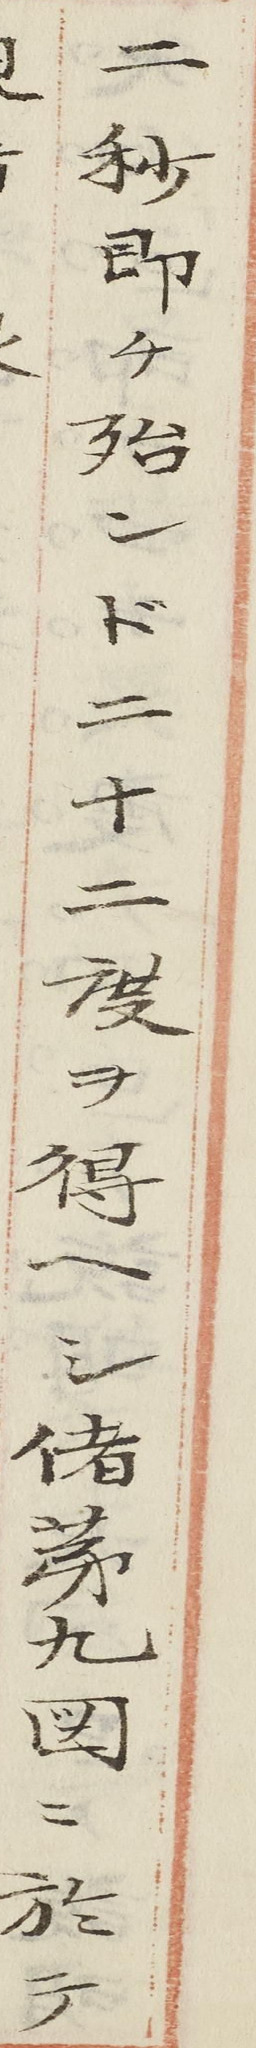二秒即チ殆ンド二十二度ヲ得ヘシ偖第九図ニ於テ
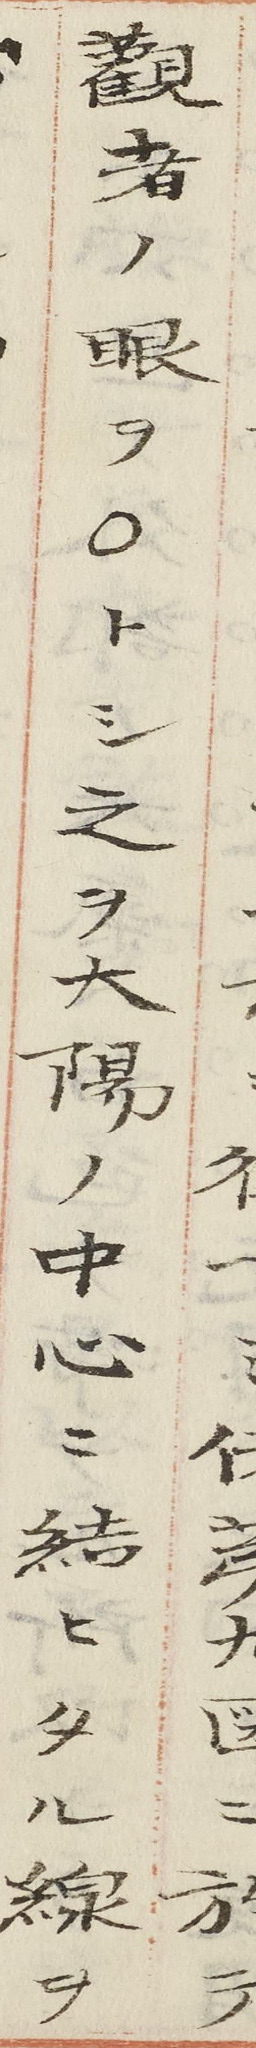観者ノ眼ヲ〇トシ之ヲ大陽ノ中心ニ結ヒタル線ヲ
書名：虹及ハロノ説明
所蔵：東京大学地震研究所図書室 Earthquake Research Institute Library, The University of Tokyo, JAPAN
